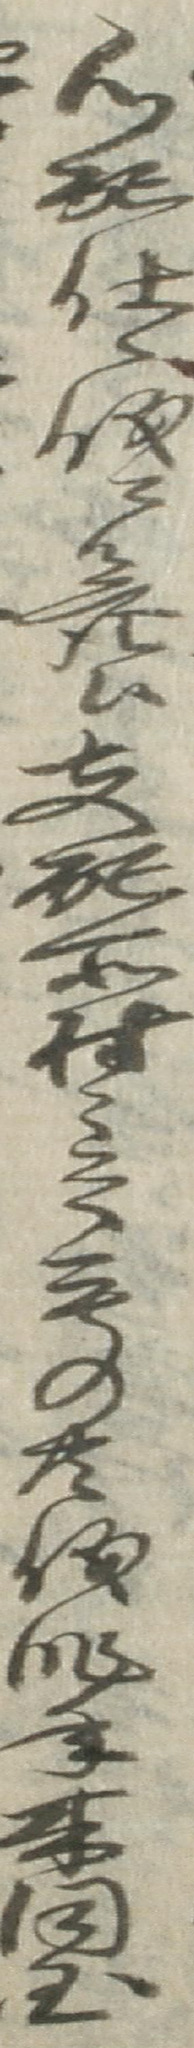心配仕候儀二御座候支配所村々之もの共儀昨年来同国
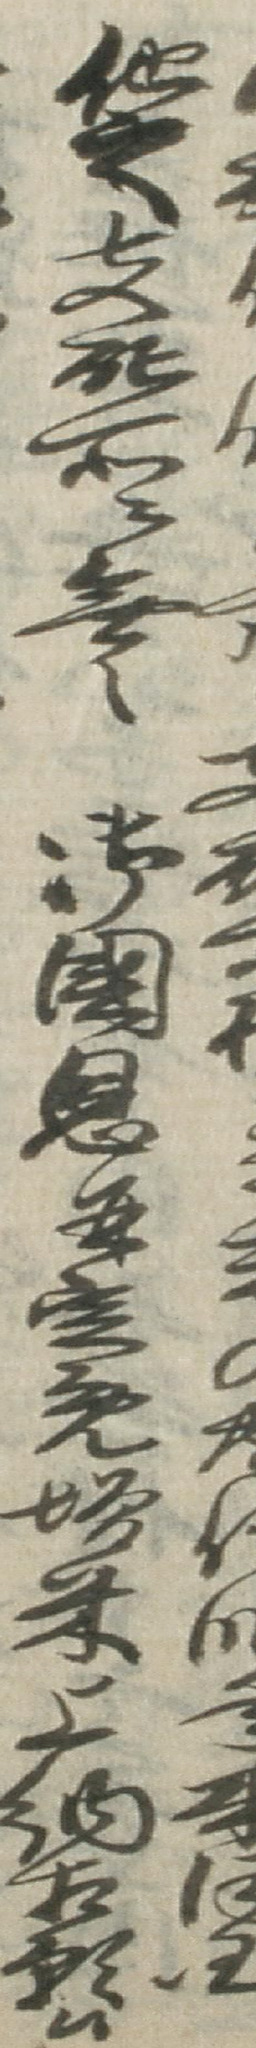他之支配所二無之御国恩并定免増米上納相願候
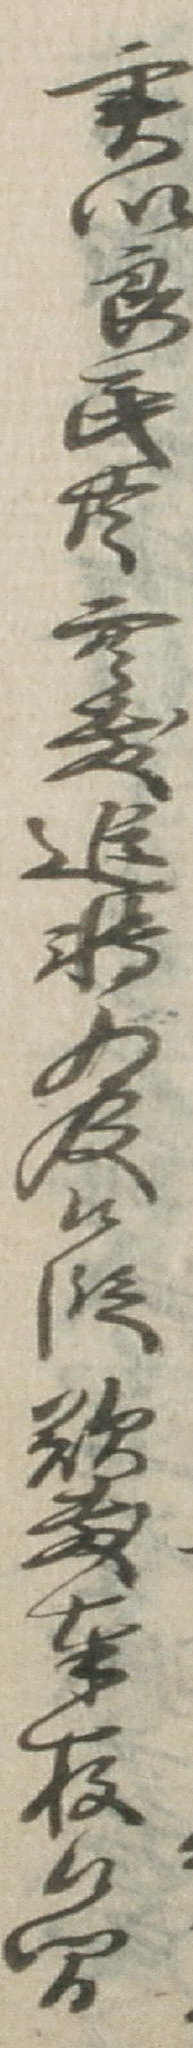実以良民共空敷退転為及候段歎ヶ敷奉存候間
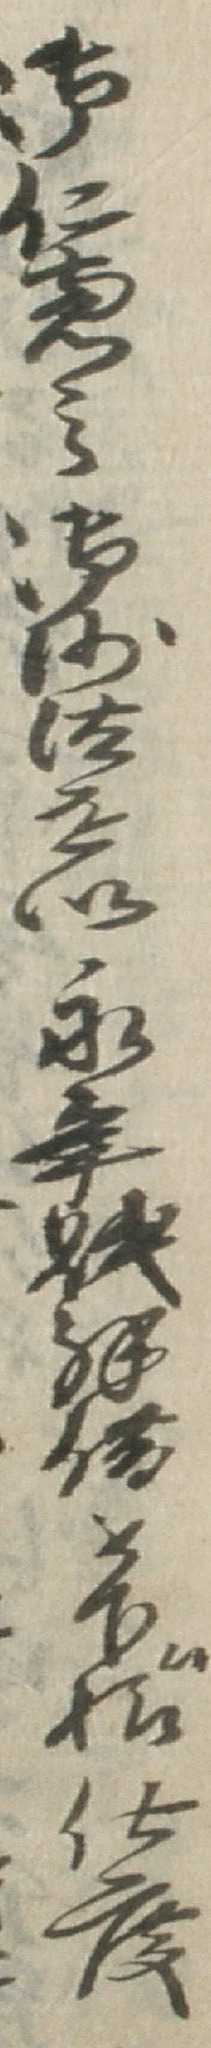御仁恵之御沙汰を以永年賦拝借被下候様仕度
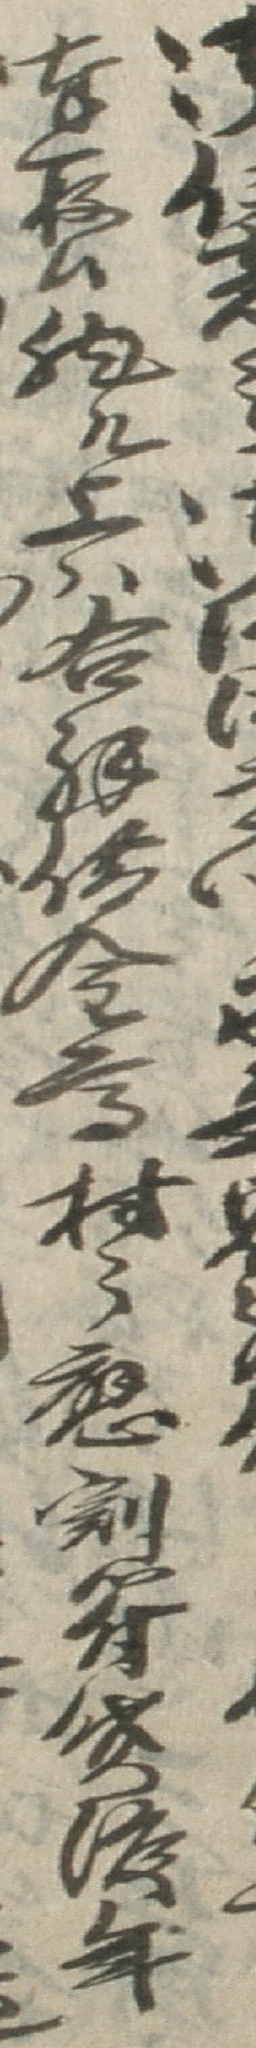奉存候然ㇽ上ハ右拝借金高村々応割符貸渡年
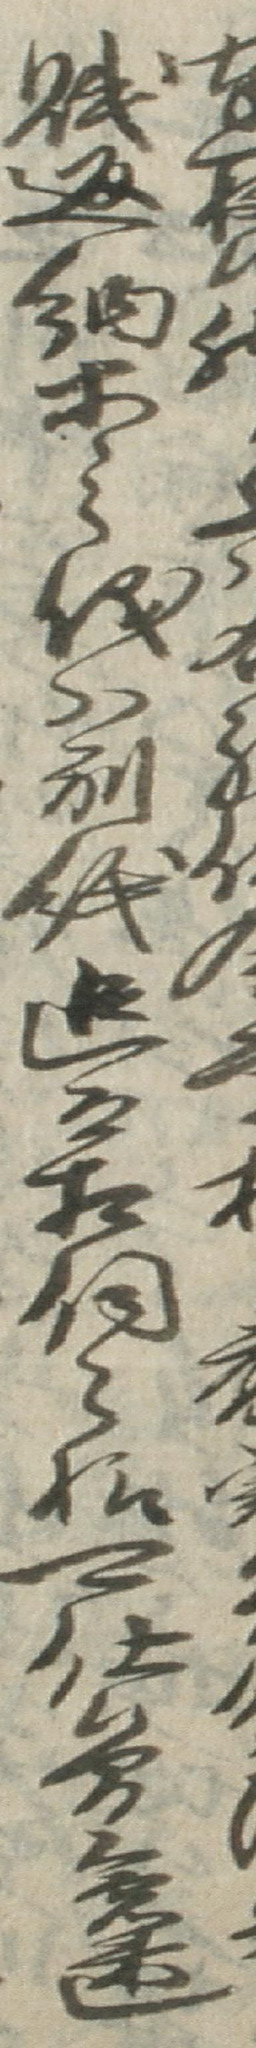賦返納等之儀ハ別紙追而相伺候様可仕候間急速
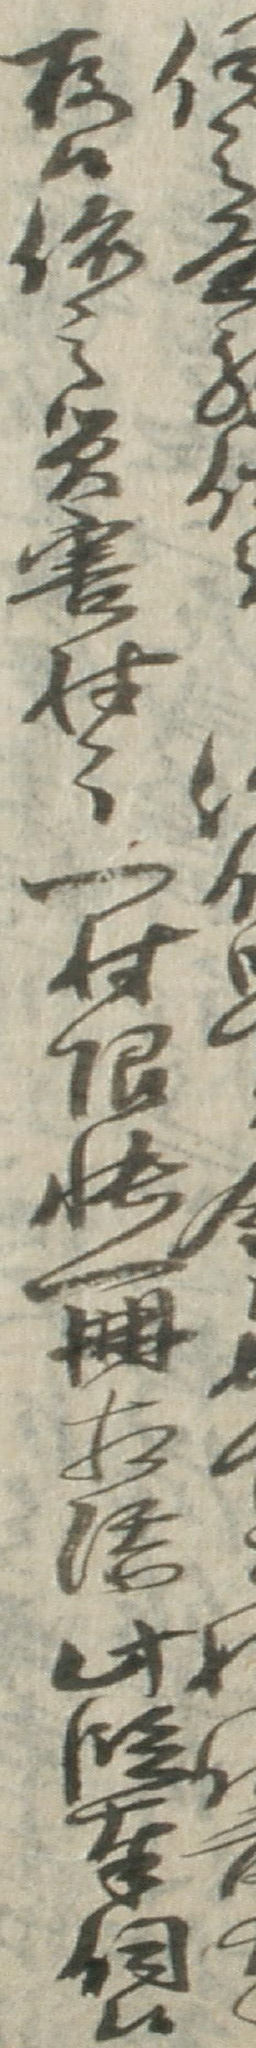災害村々之一村限帳壱冊相添此段奉伺候
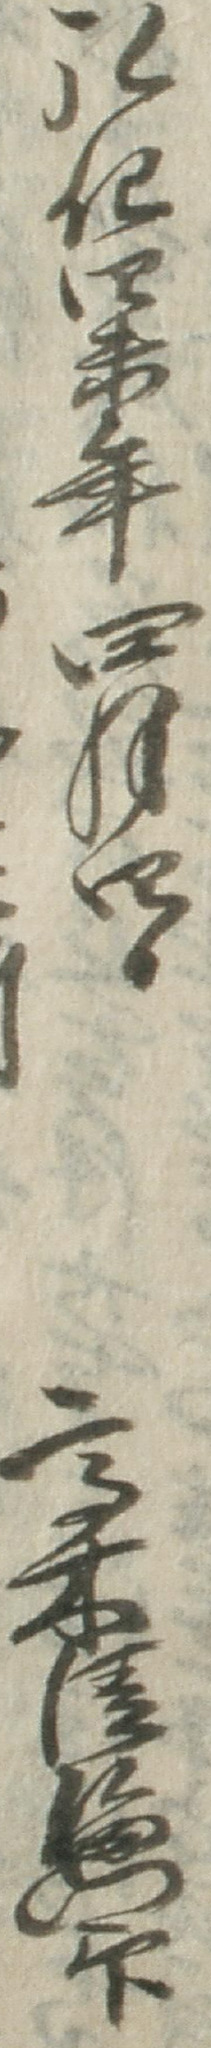弘化四未年四月四日高木清左衛門印
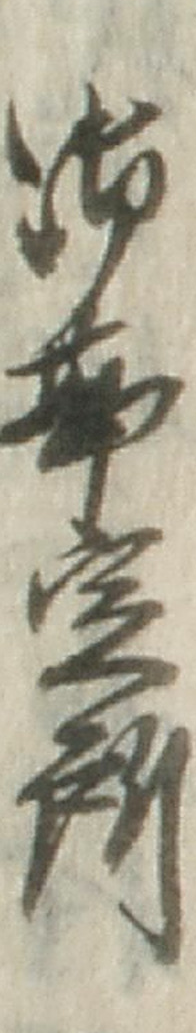御勘定所
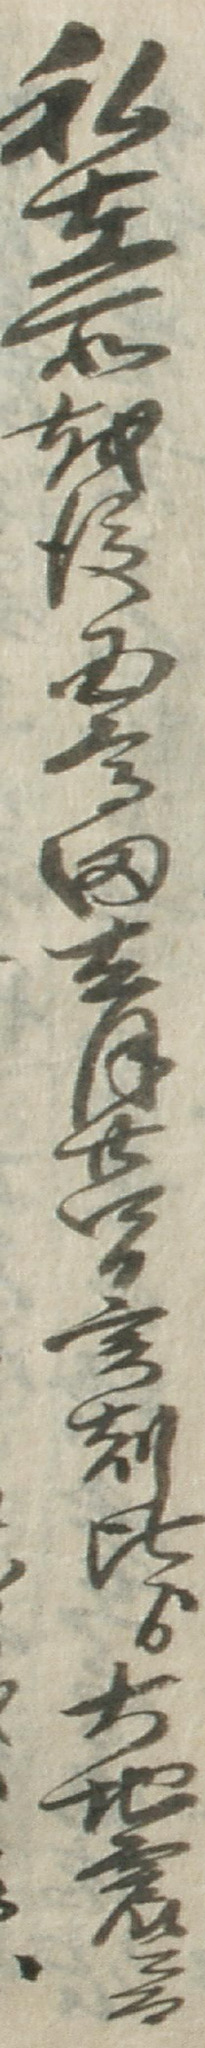私在所越後国去月廿四日亥刻比ゟ大地震二而
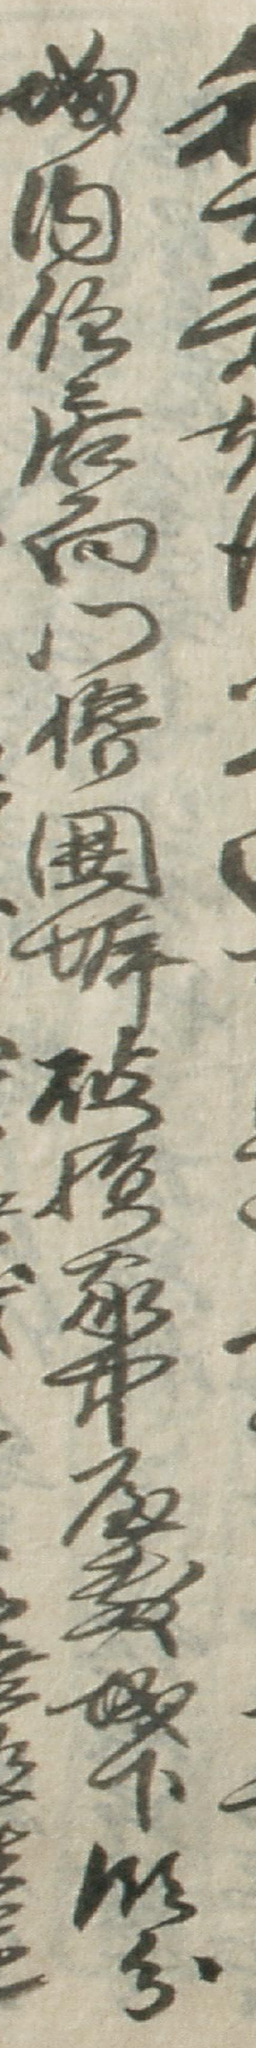城内住居向門櫓囲塀破損家中屋敷城下領分
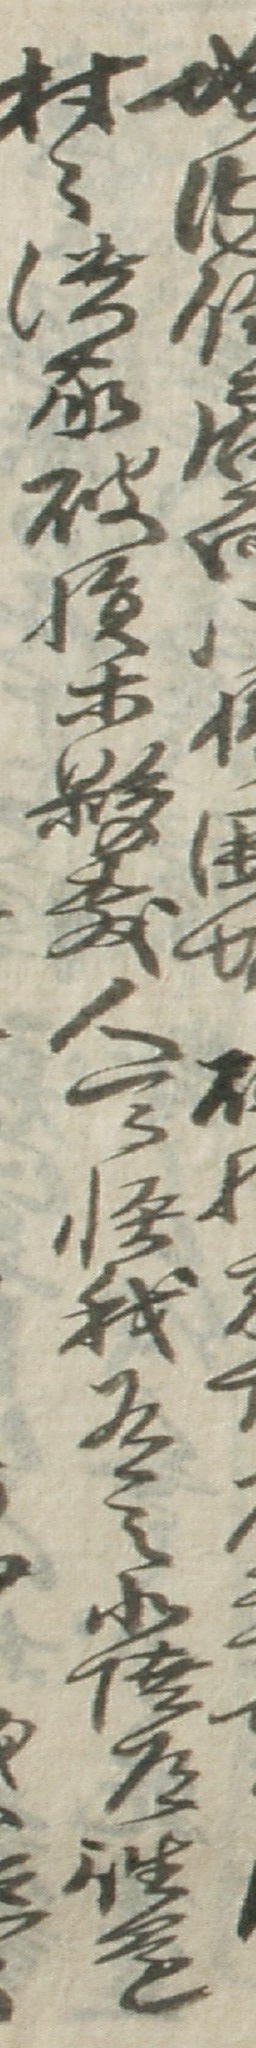村々潰家破損等夥敷人馬怪我有之北陸道往還
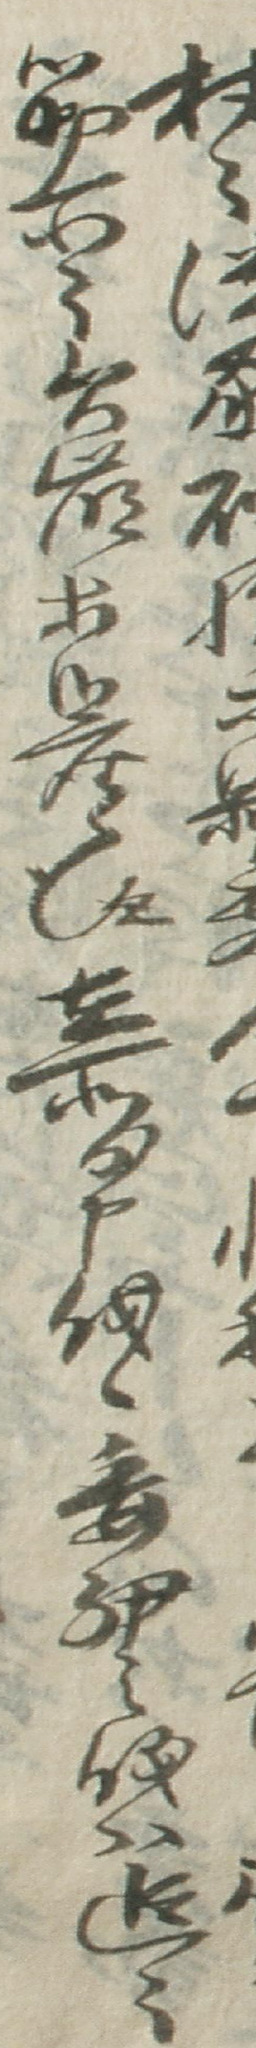筋所々欠崩等御座候趣在所ゟ申越候委細之儀ハ追々
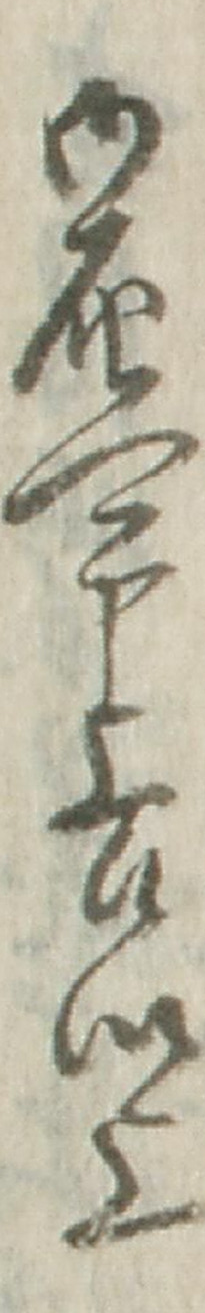御届可申上候以上
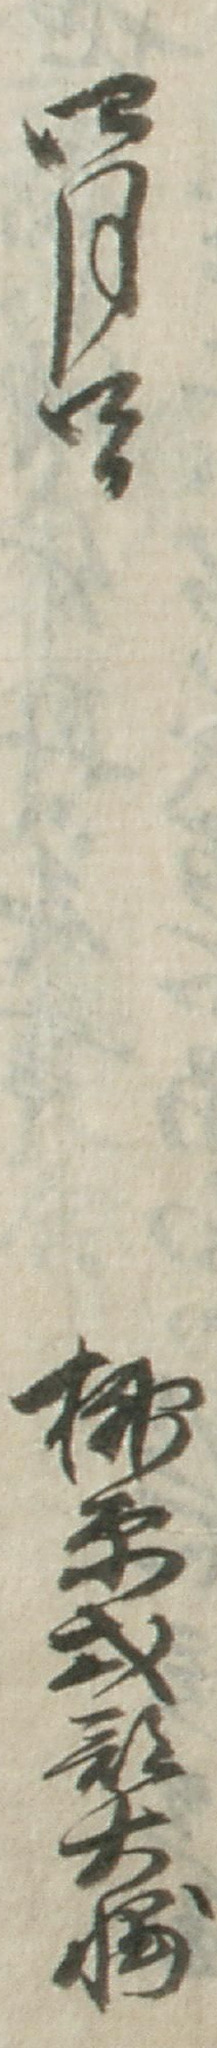四月四日榊原式部大輔

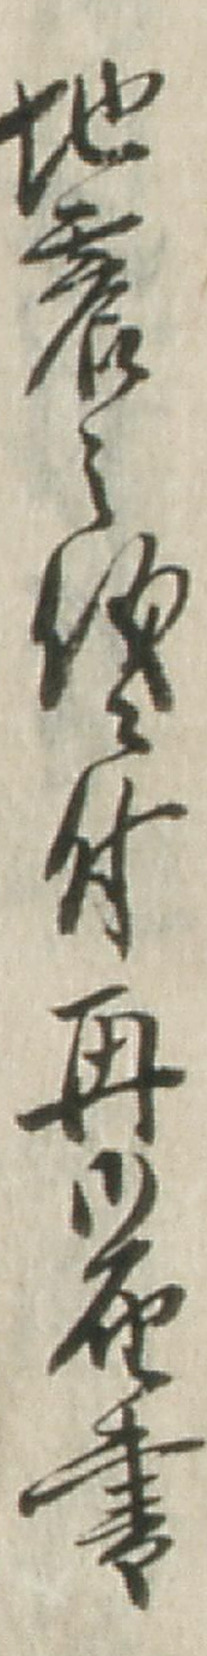地震之儀二付再御届
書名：信濃國地震實録記
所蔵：東京大学地震研究所図書室 Earthquake Research Institute Library, The University of Tokyo, JAPAN
